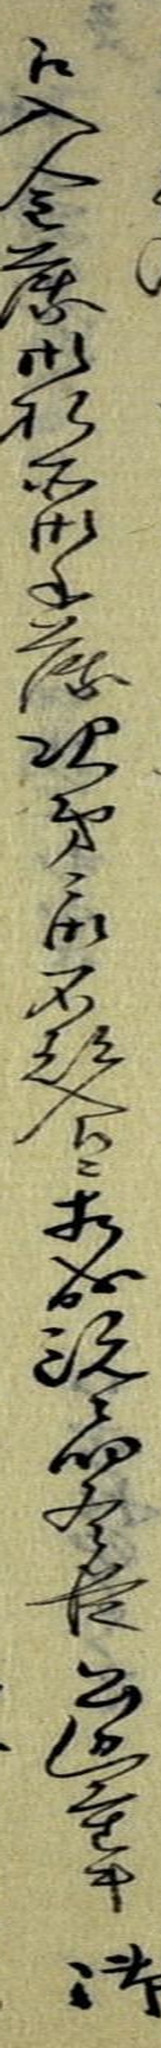江入金薄御札所御手薄次第に御不都合に相成既に旧冬従公辺重キ御
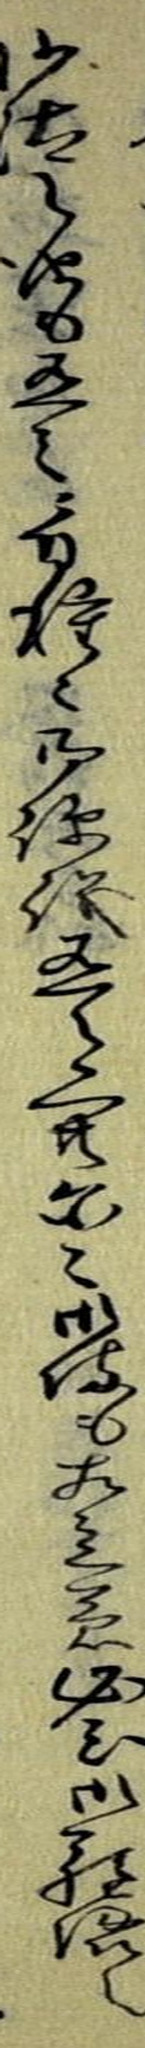沙汰之儀も有之候付種々御評議有之候へ共示々御備も相立兼必至御難渋之
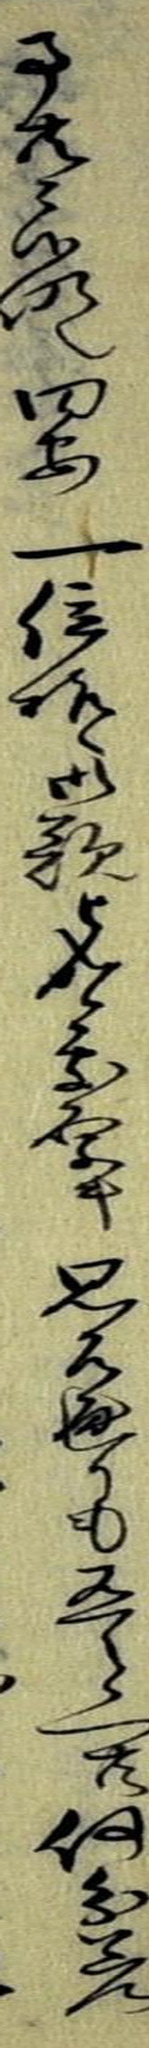事共に候仍之田安一位様へ御歎被成候処厚キ思召通りも有之候へ共何分差
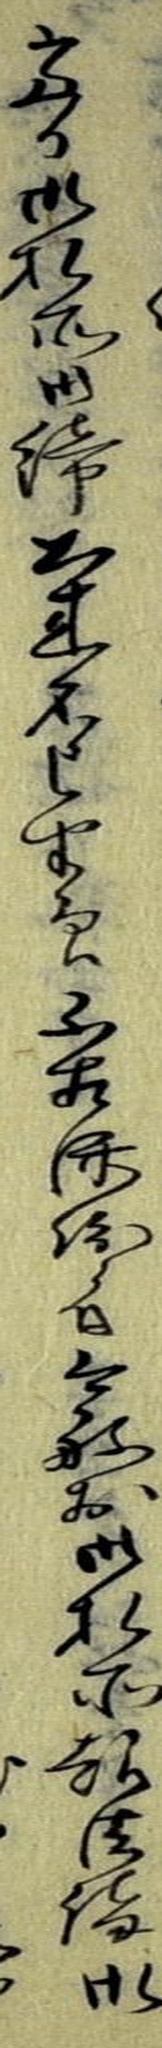当り御札所御締出来不申候半而は不相済儀に付今般於御札所趣法講御
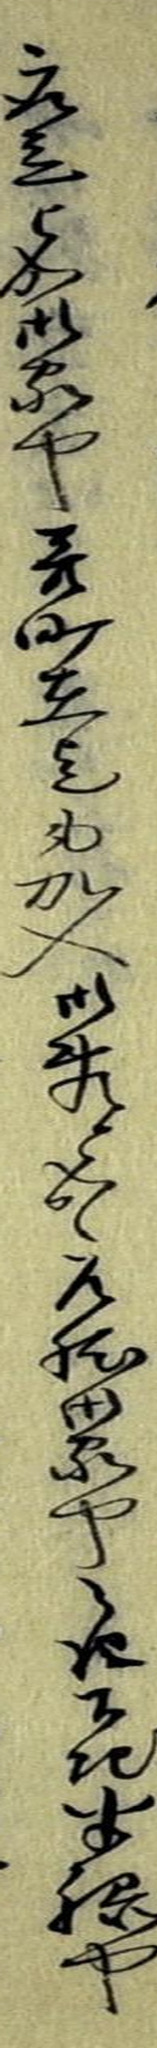取立被成御家中并町在迄も御加入御頼被成候乍然御家中之儀下地半減中
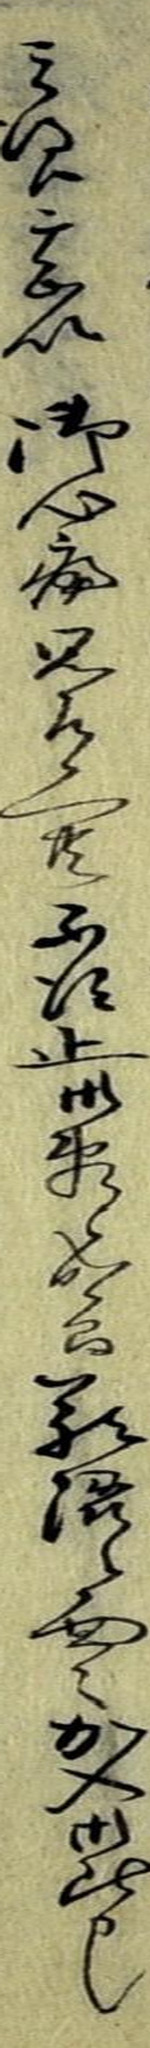に候得は甚以御心痛思召候へ共不得止御頼被成候間難渋之面々加入御断申候
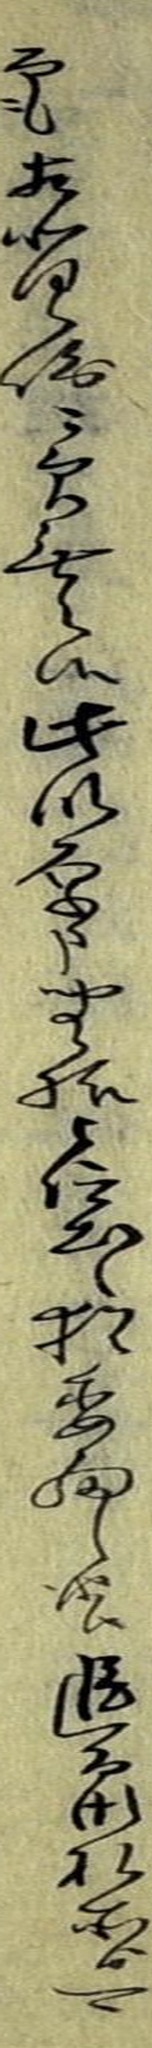而も相背候儀に而は無之候此段厚申聞候様被仰出候猶委細之儀は追而御札所ゟ可
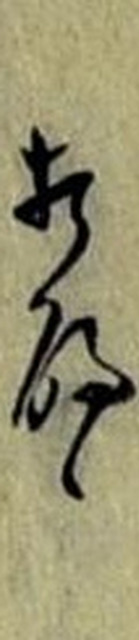相触候
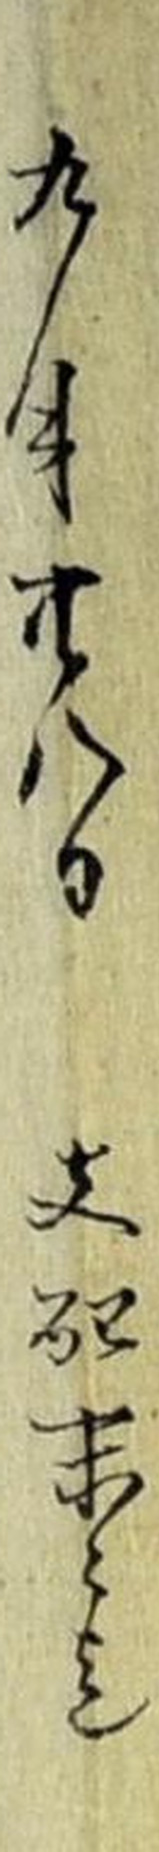九月廿八日支配末々迄
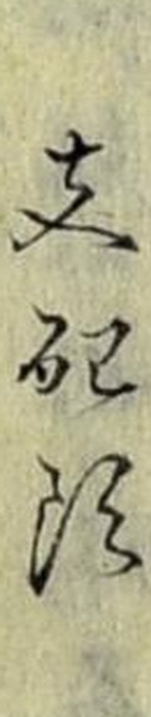支配頭
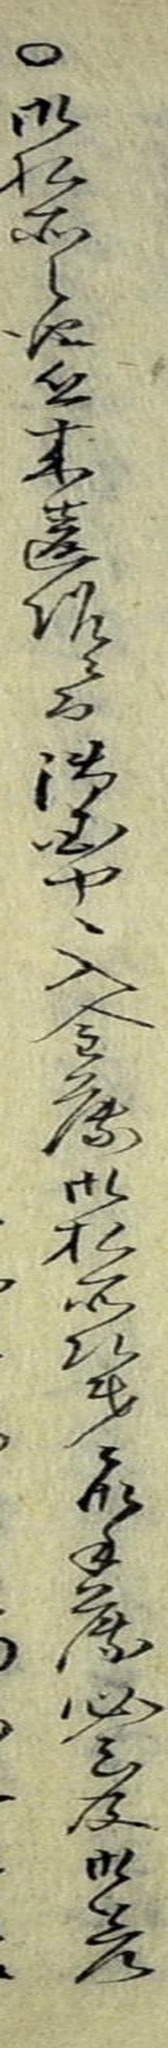○御札所之儀近来違作に而御国中へ入金薄御札所次第に御手薄必至及御差
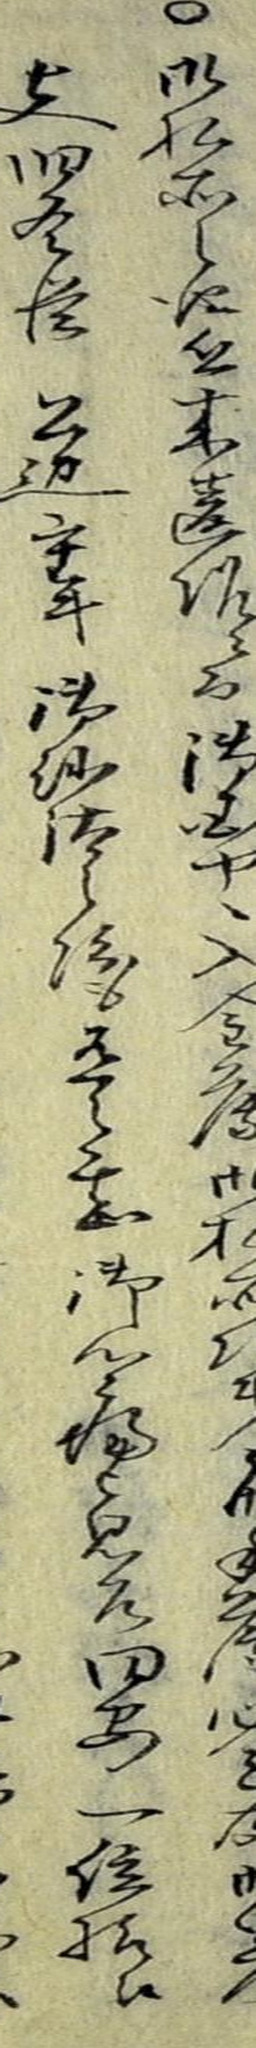支旧冬従公辺重キ御沙汰之儀も有之甚御心痛被思召田安一位様江
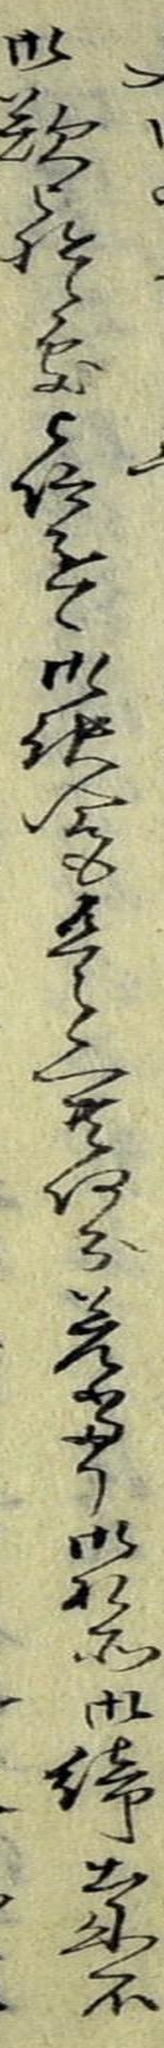御歎被遊候処被仰進候御訳合も有之候へ共何分差当り御札所御締出来不
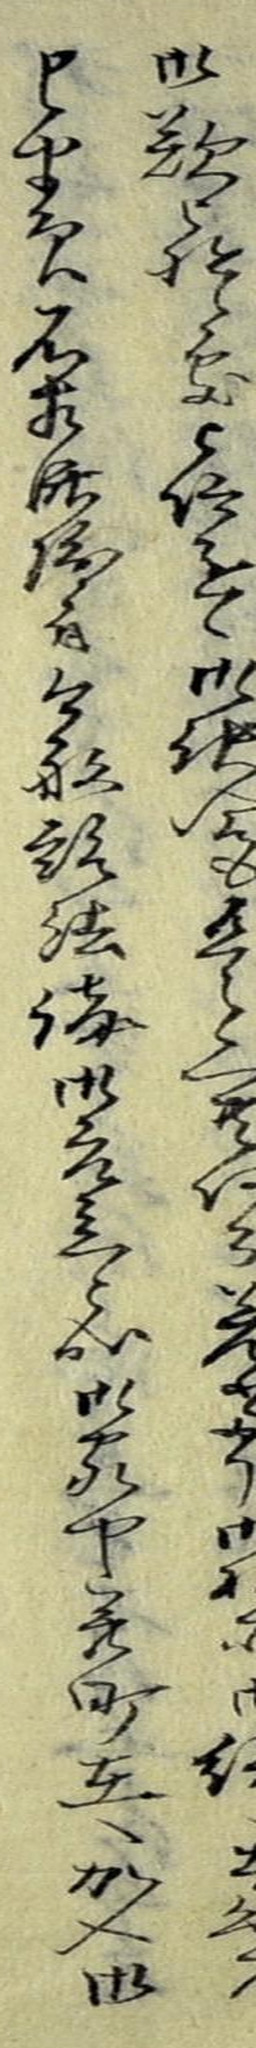申候半而は不相済儀に付今般趣法講御取立被成御家中町在へ加入御

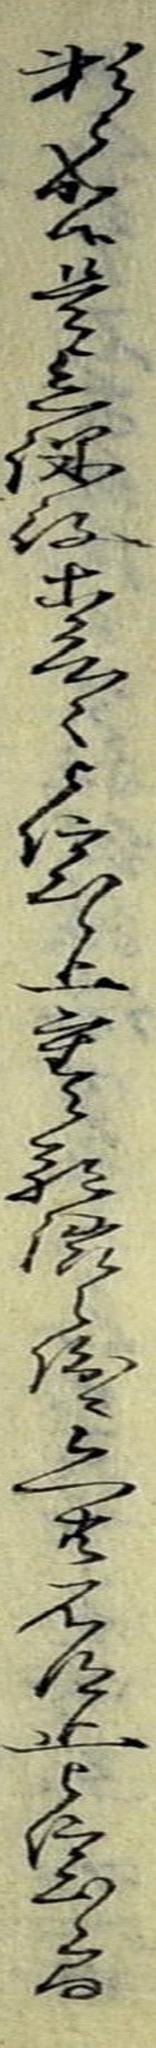頼被成候是迄課役等度々被仰出候上重々難渋之儀に候へ共不得止被仰出候間
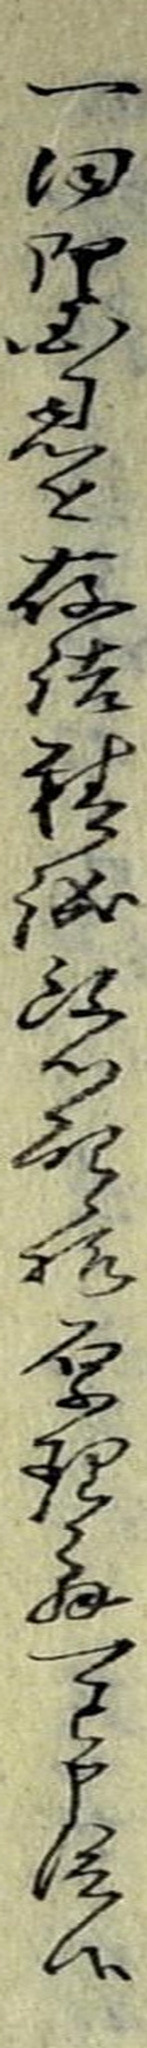一同御国恩を存詰精誠致心配候様厚理解可被申渡候
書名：命令之部 六
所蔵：福井県文書館 Fukui Prefectural Archives
